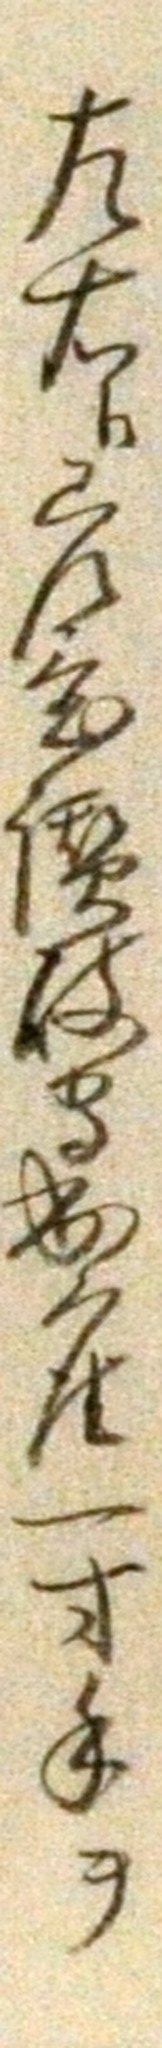左右え差置讃岐守出座一寸手ヲ
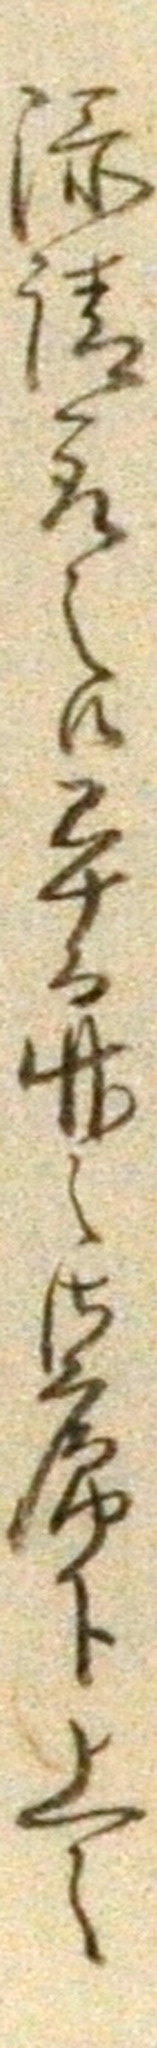添請取之候畢而竹之御廊下上之
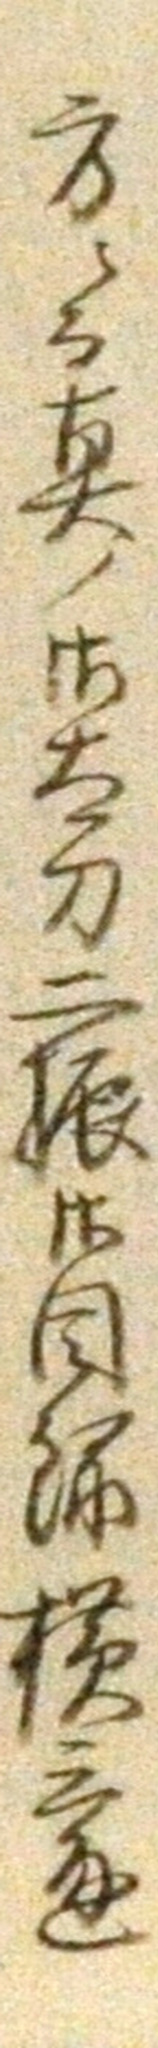方ニ而真ノ御太刀二振御目録横三通
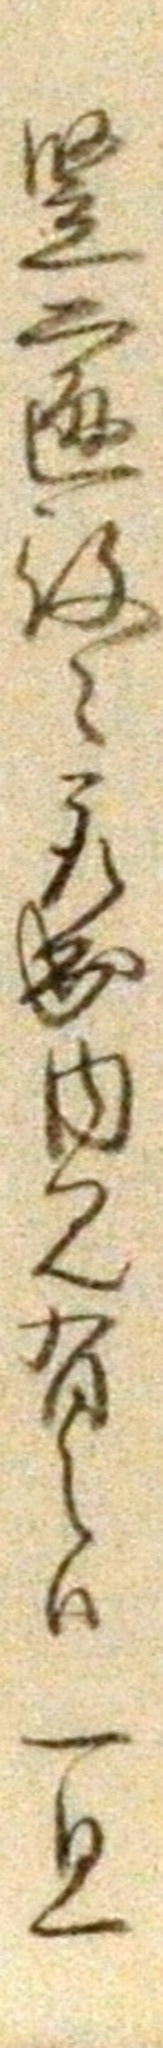竪二通役々取出内見有之候一旦
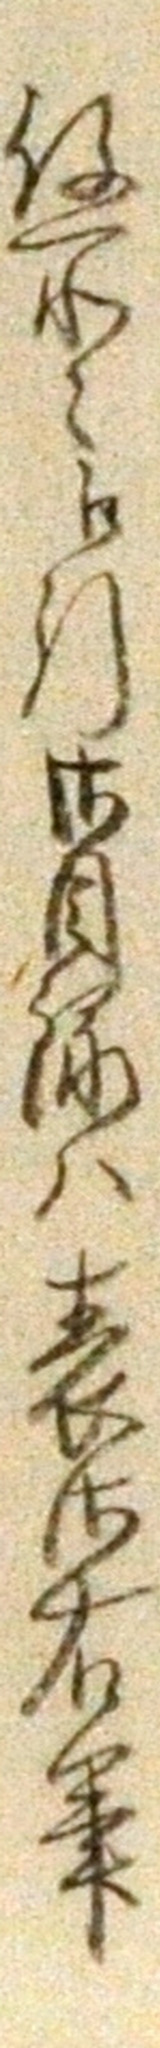役所々え引御目録ハ表御右筆
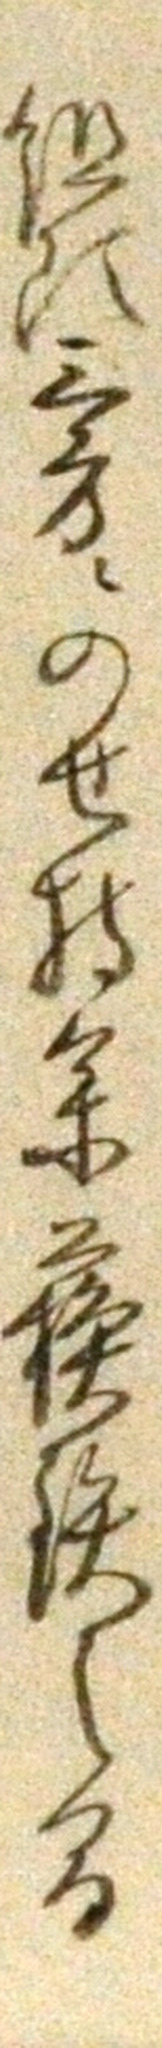組頭三方ニのせ持参蘇鉄之間
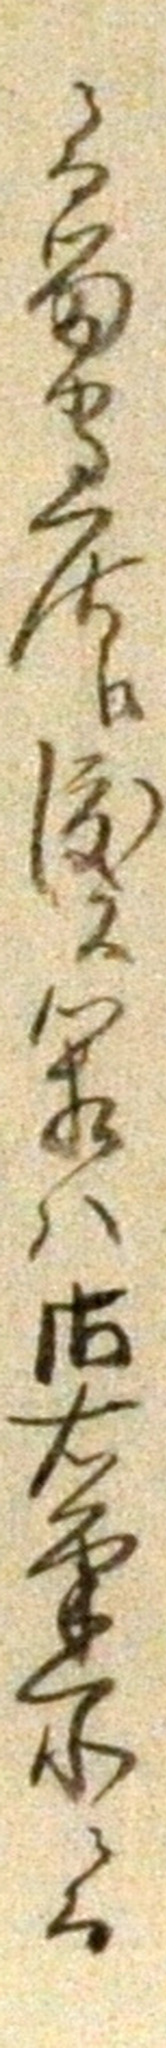ニ而留守居え渡ス箱ハ御右筆所ニ而
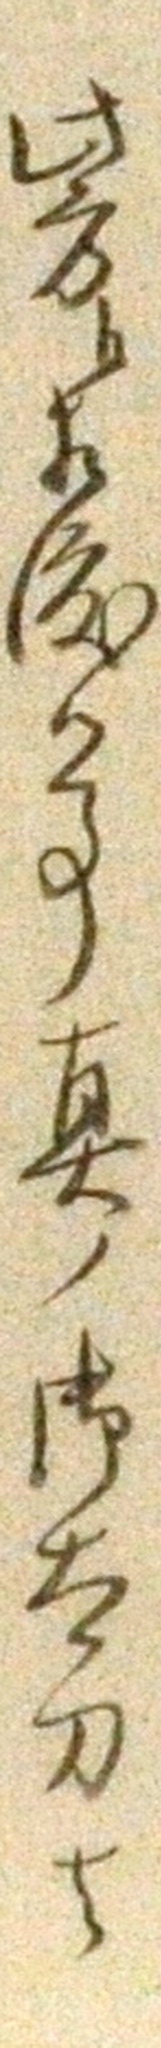此方え相渡候事真ノ御太刀は
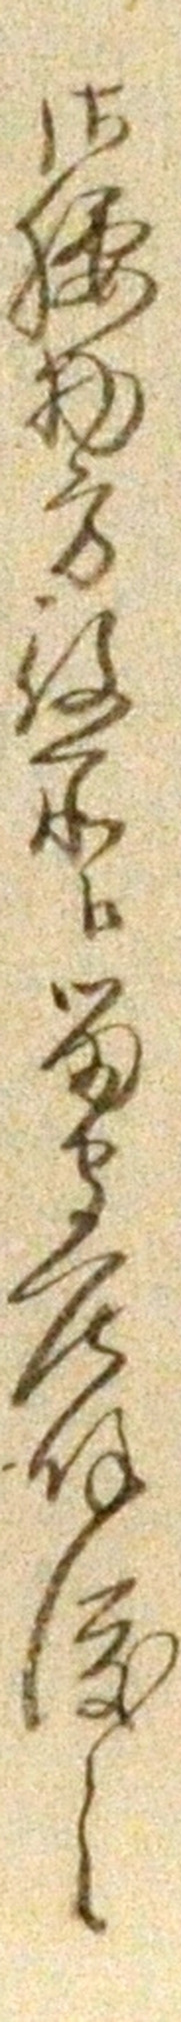御腰物方役所え留守居役渡之
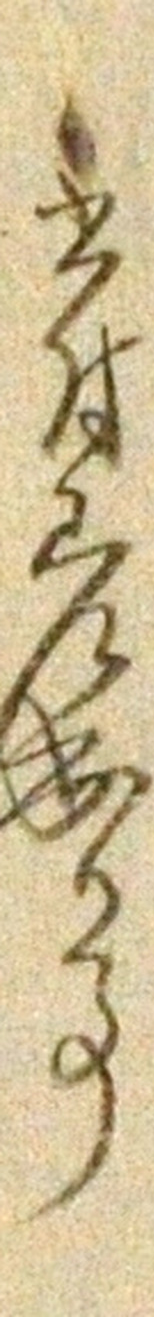書付差出候事
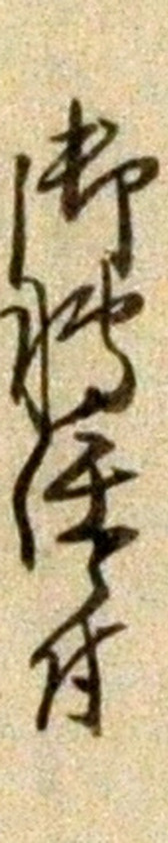御転任ニ付
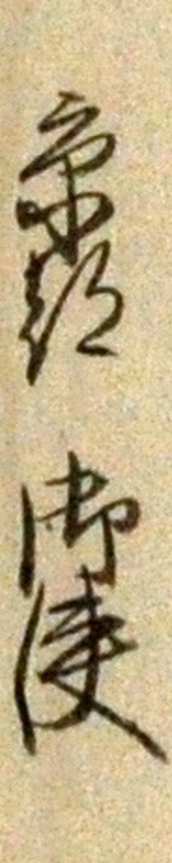京都御使
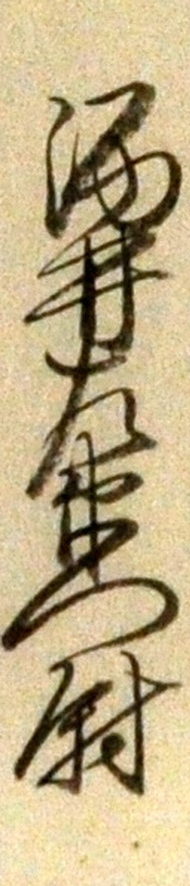酒井左衛門尉
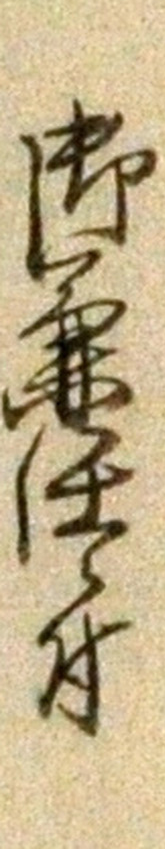御兼任ニ付
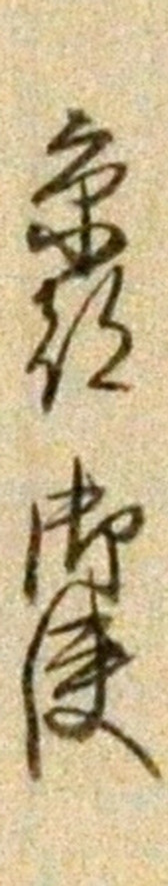京都御使
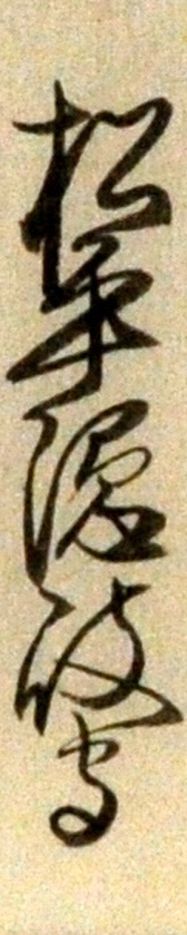松平隠岐守
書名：御馳走御能ノ節ノ留外
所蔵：伊那市立高遠町図書館・合同会社AMANE
